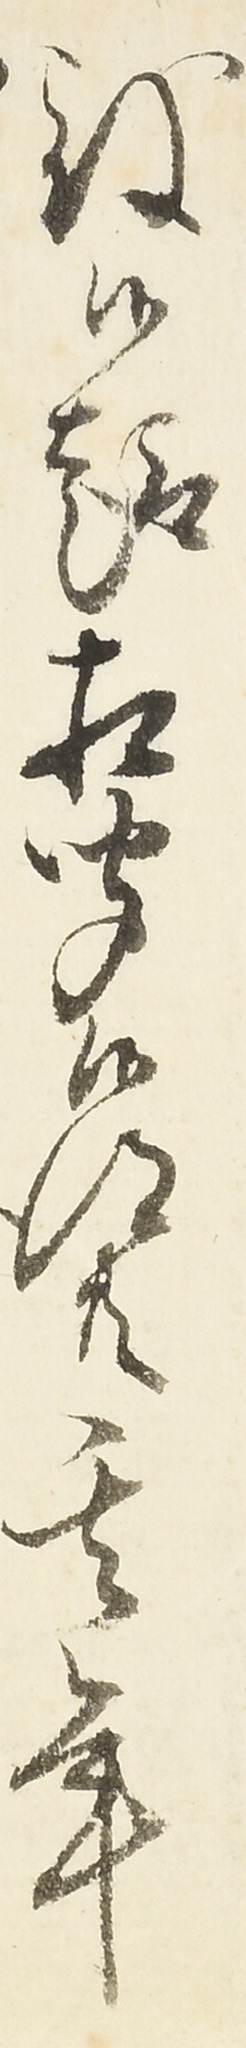致候趣相聞候得共其年
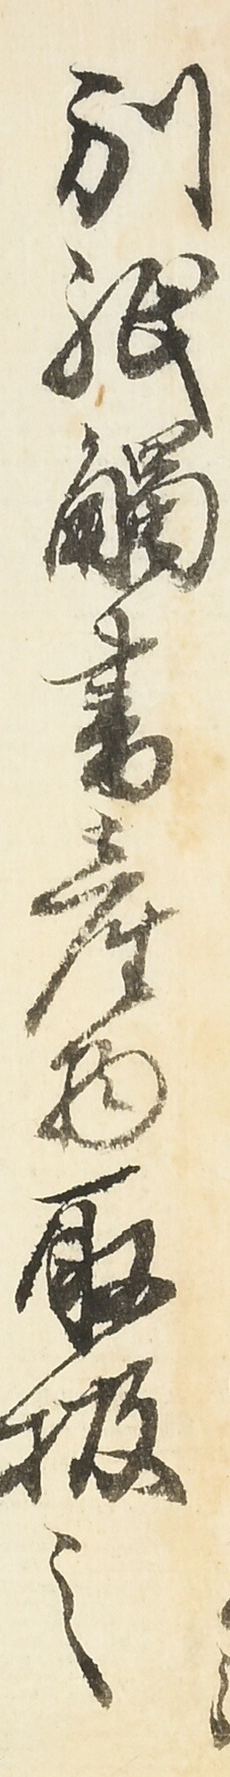別紙触書産物取扱之
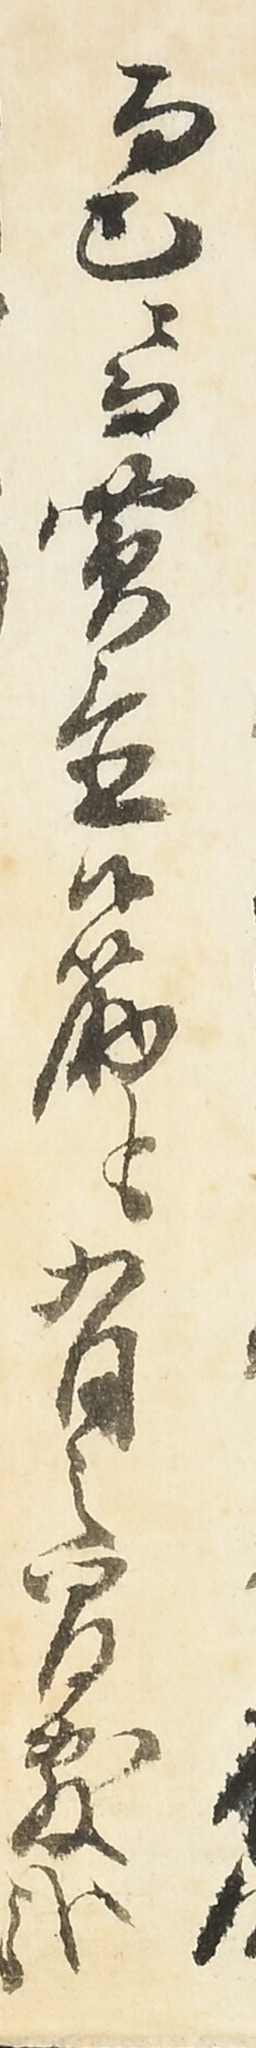而己ニ而買置候筋も有之間敷哉
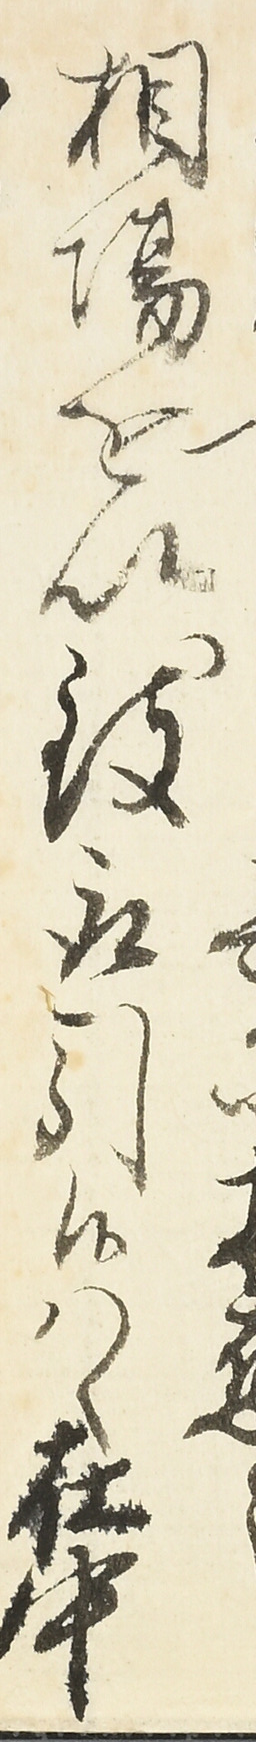相場を以致取引候ハゝ在中
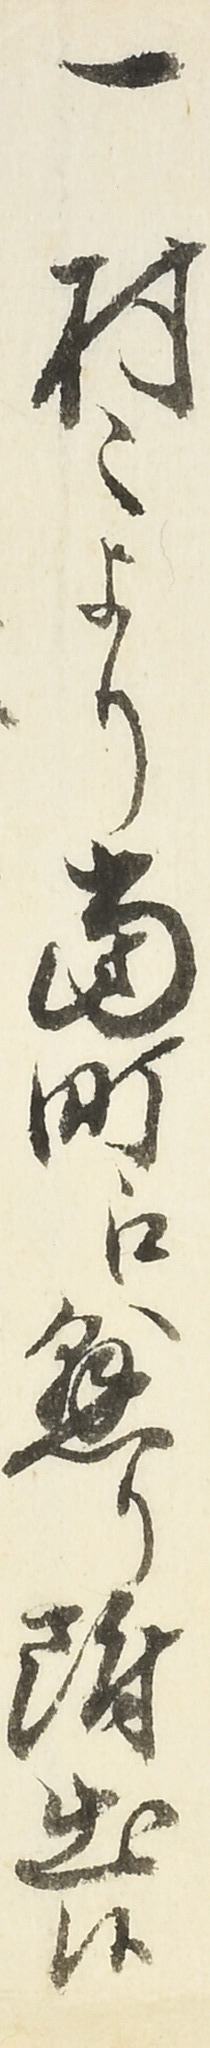一村々より当町江懸り付出候
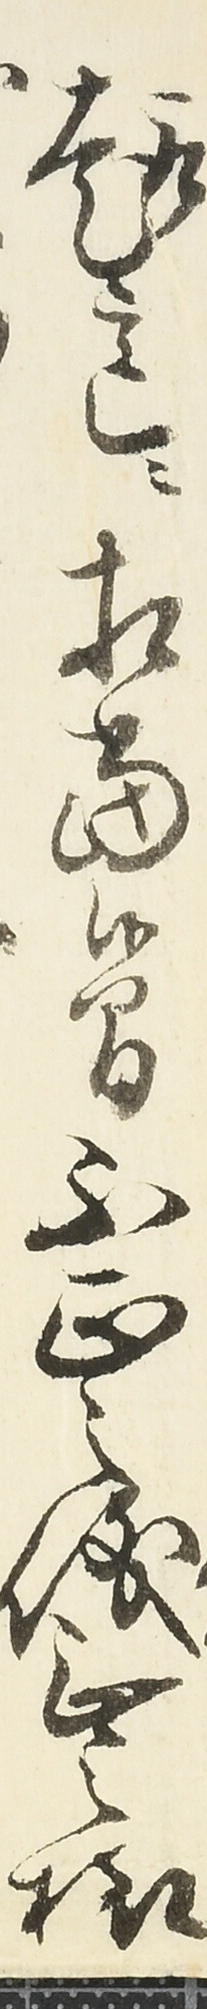趣意ニ相当候間不正之儀無之様
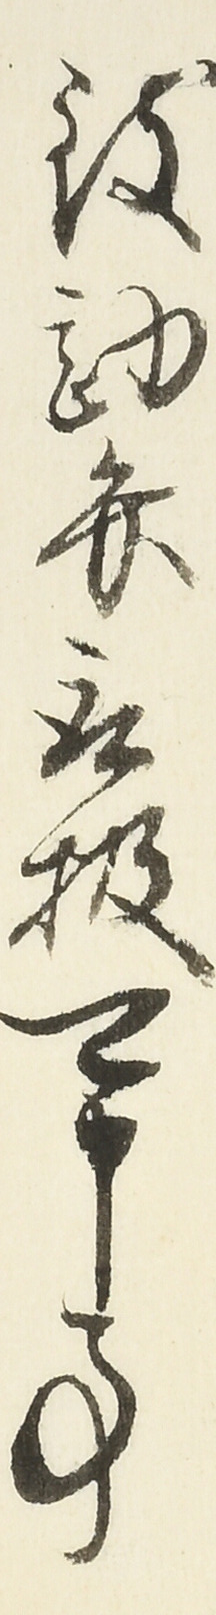致勘弁取扱可申事
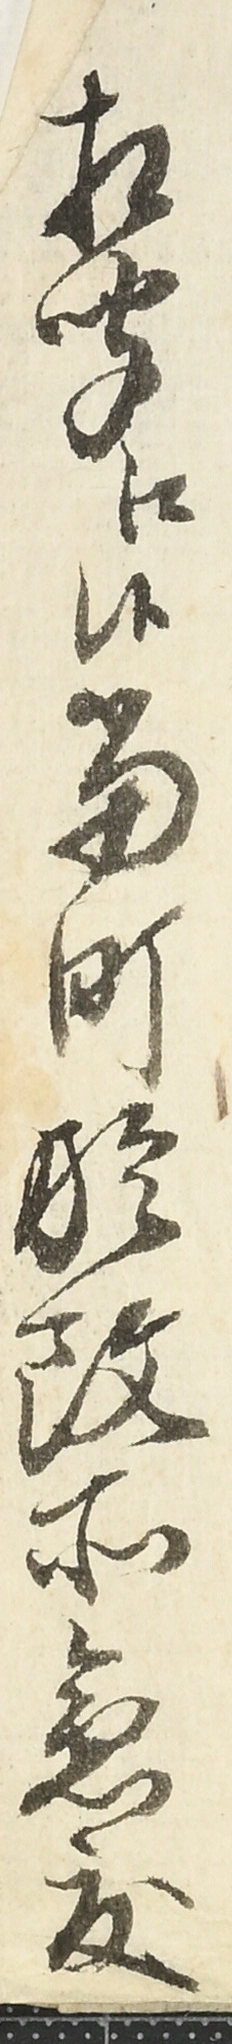相聞江候当町於改所急度
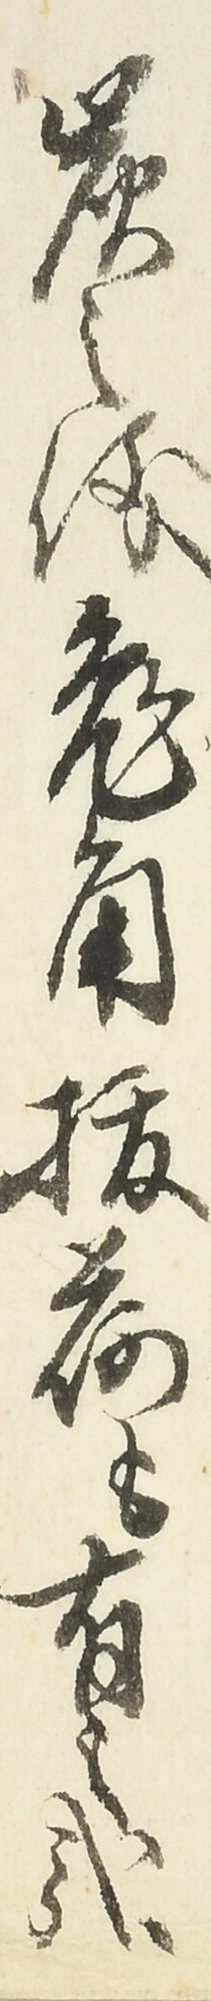炭之儀兎角抜荷も有之哉

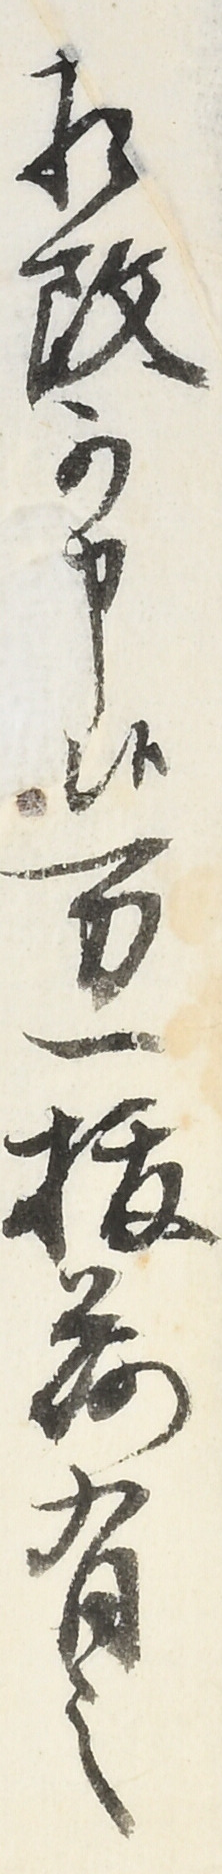相改可申候万一抜荷有之
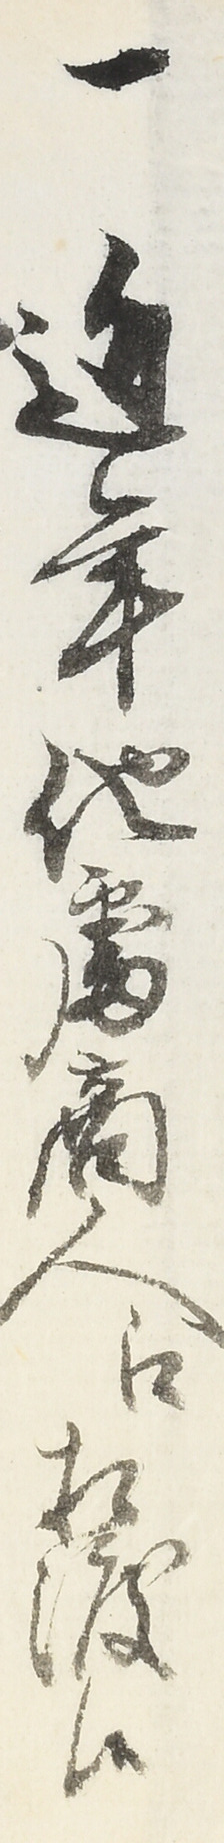一近年他処商人江相渡候
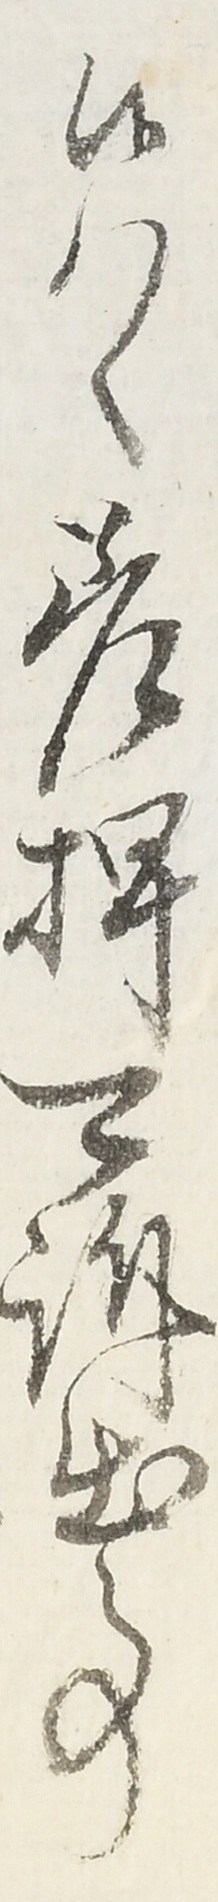候ハゝ差押可訴出事
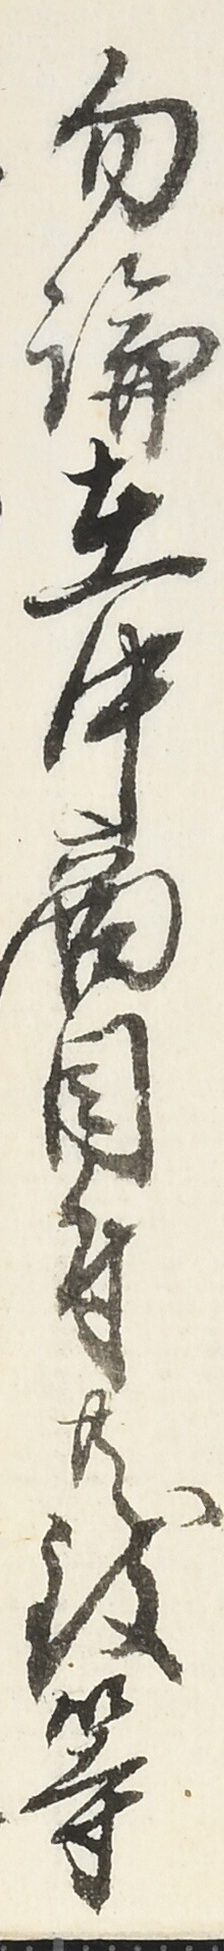勿論在中商目付共致等
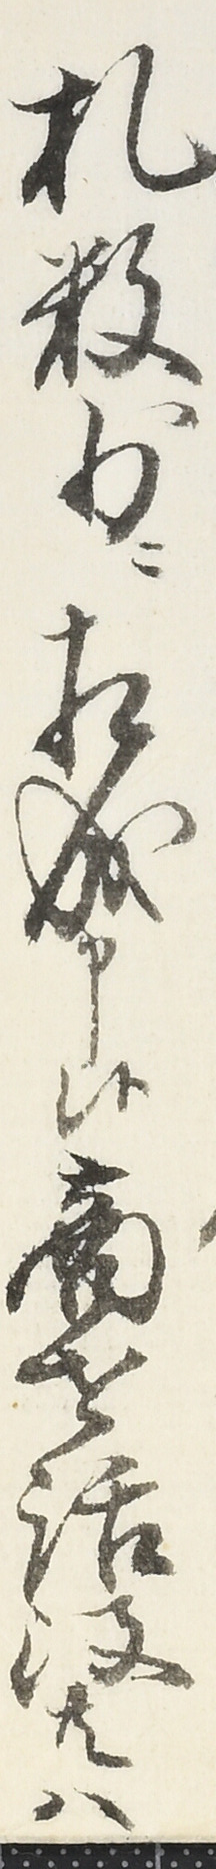札数少ニ相成申候商世話役共ハ
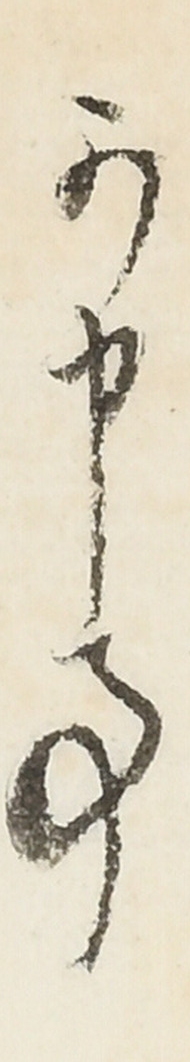可申事
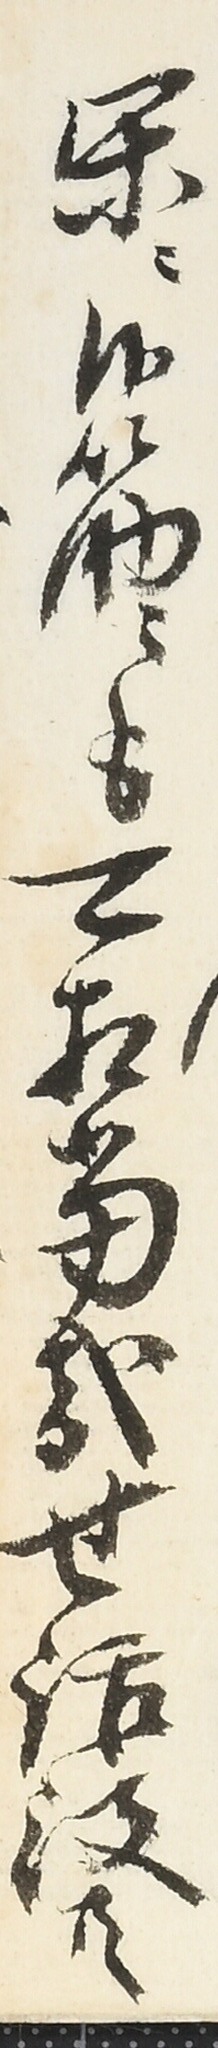閑ニ候筋ニも可相当哉世話役共
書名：町方江別紙申渡
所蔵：伊那市立高遠町図書館・合同会社AMANE
